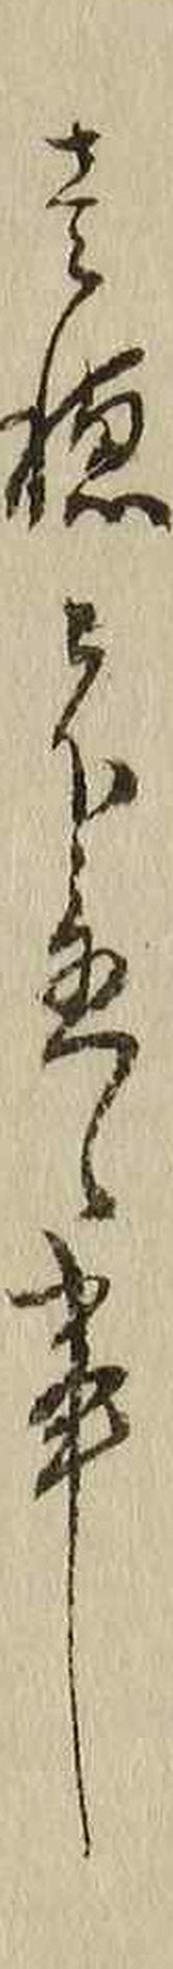壱穂被下置候事
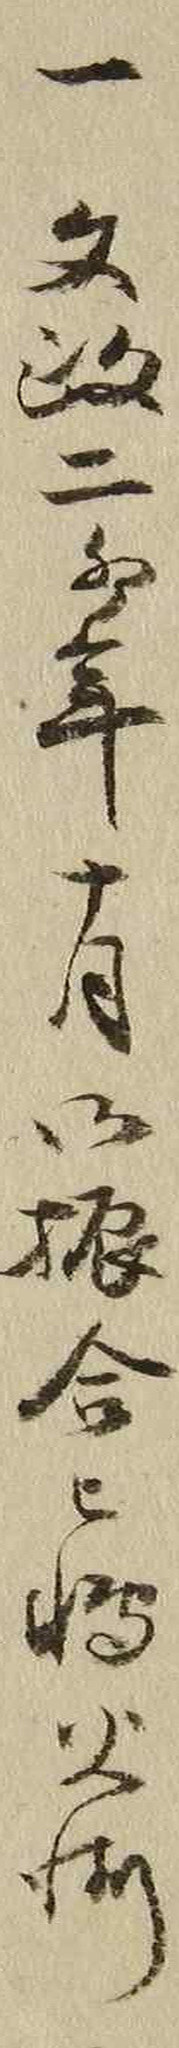一文政二卯年十月御振合被転火術
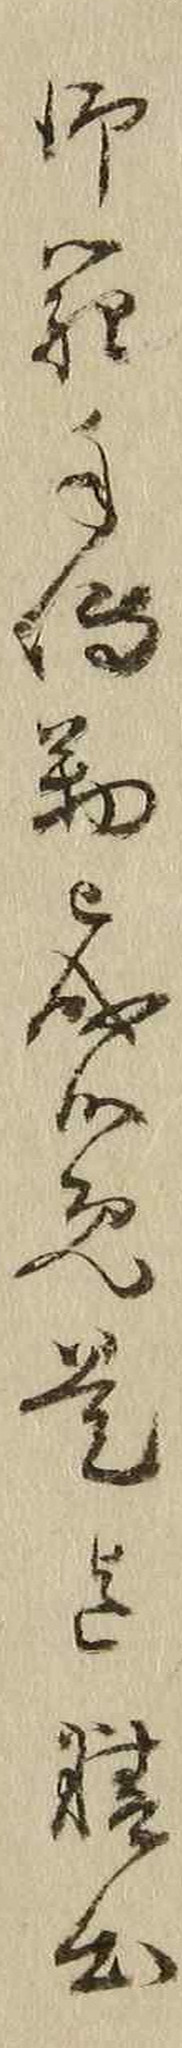師範手伝勤被成御免是迄精出
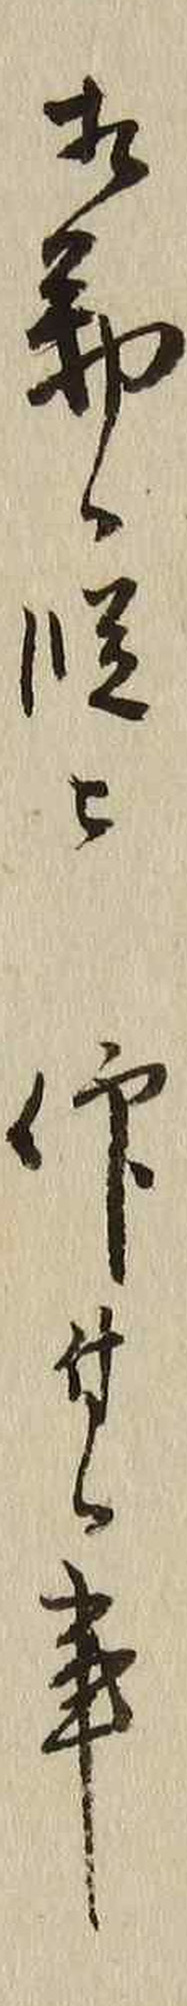相勤候段被仰付候事
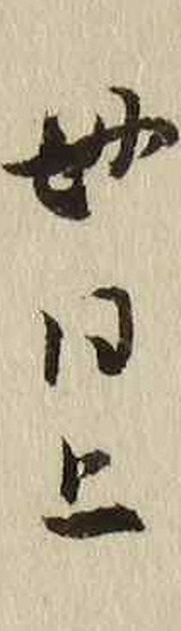母同上
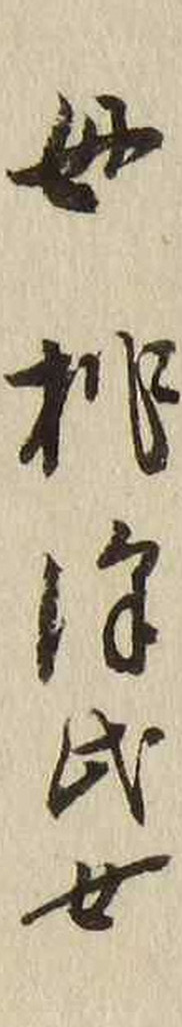母桃沢氏女

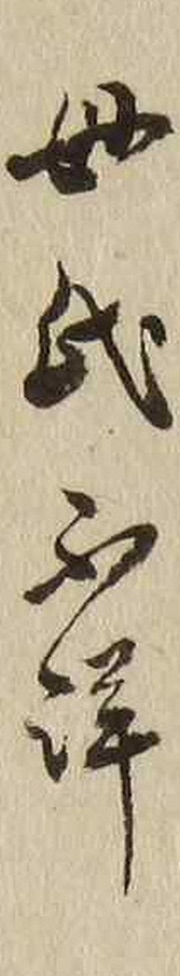母氏不詳
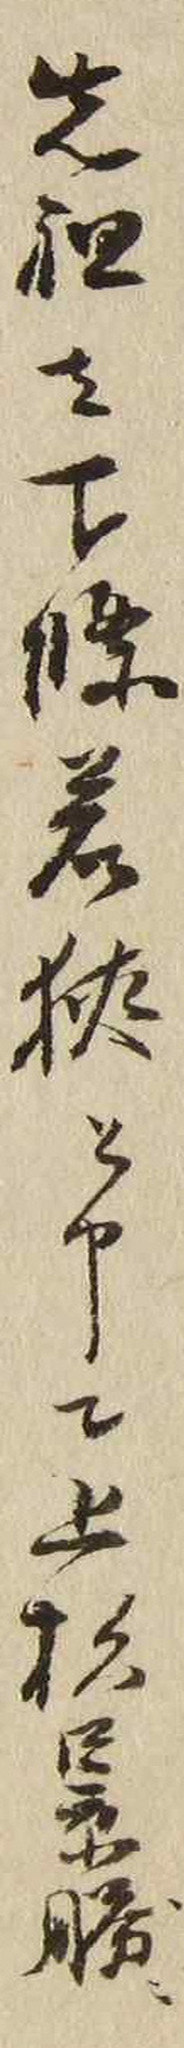先祖者下条若狭と申て上杉景勝ニ
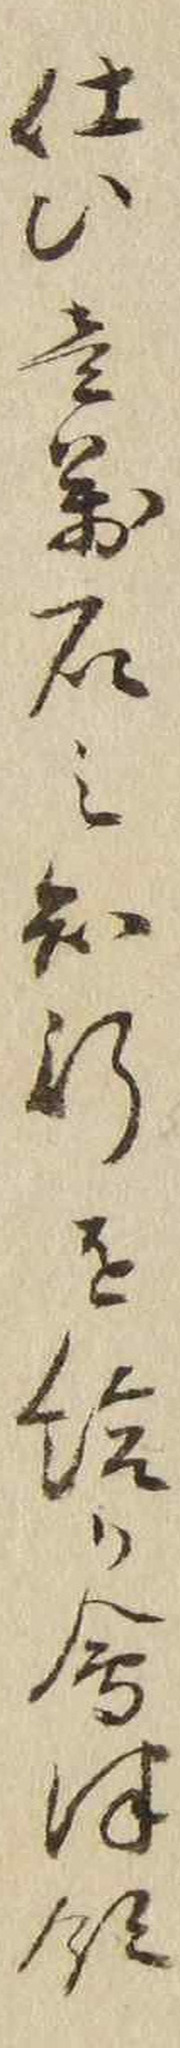仕ひ壱万石之知行を給り会津領

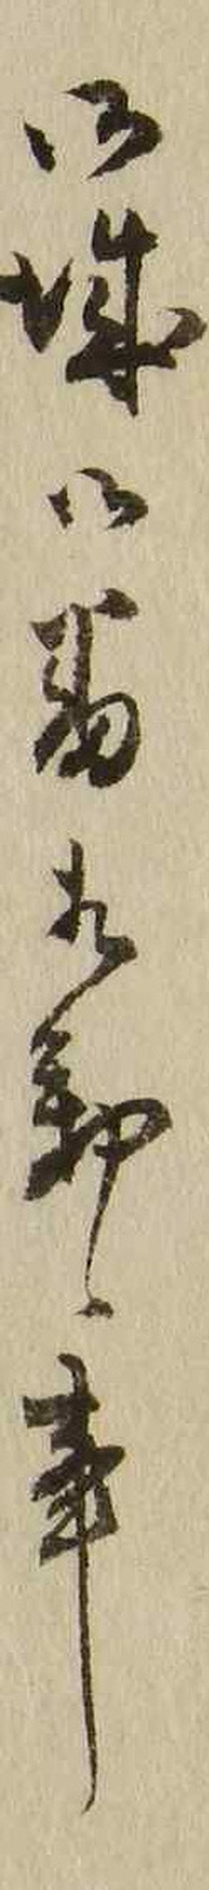御城御番相勤候事
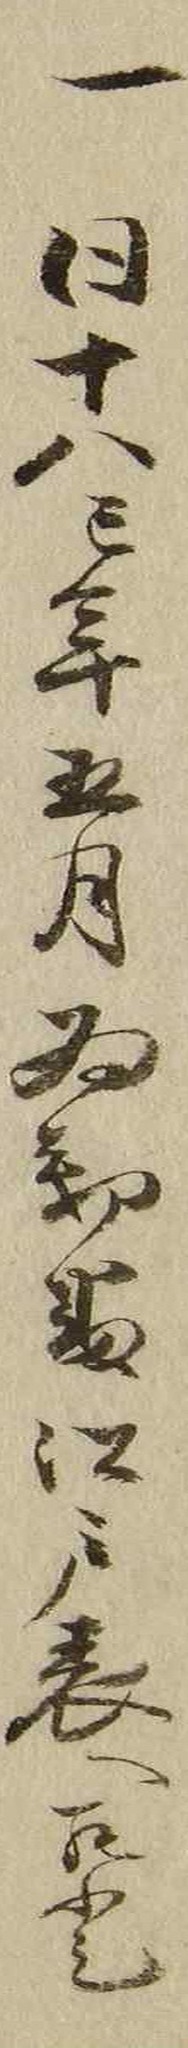一同十八巳年五月為勤番江戸表へ罷登
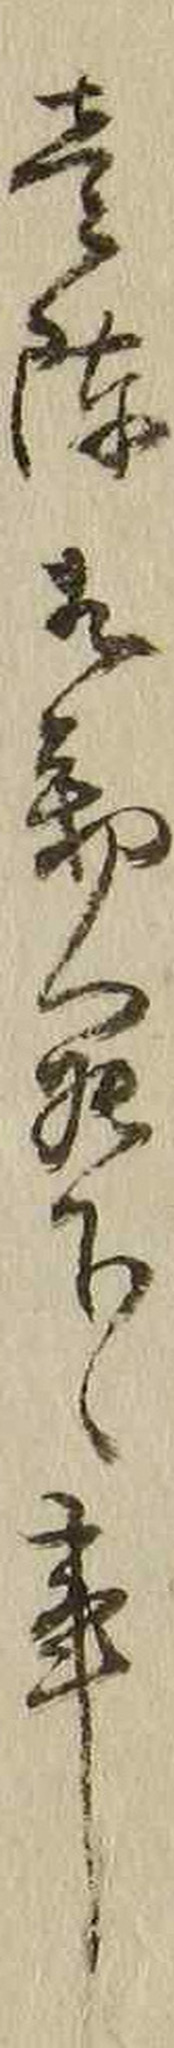登壱陣相勤罷下候事
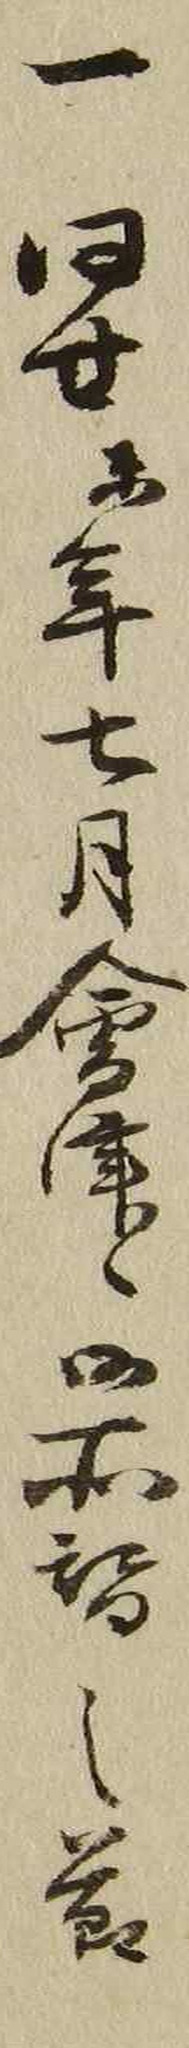一同廿未年七月会津へ御所替之節
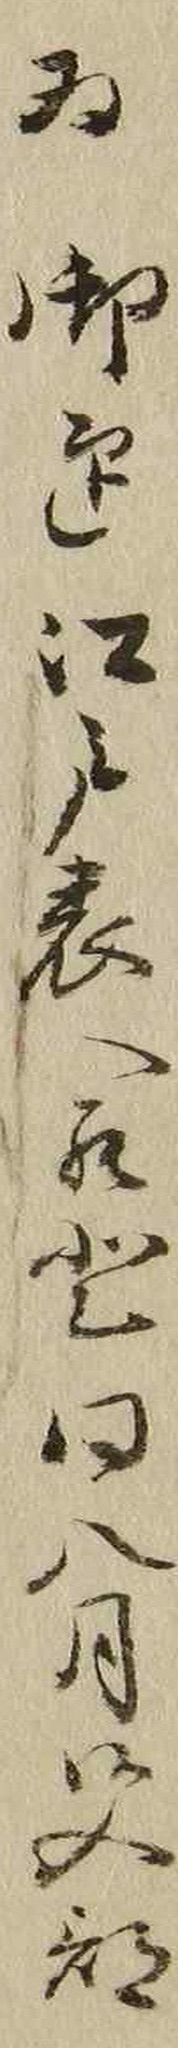為御迎江戸表へ罷登同八月御入部
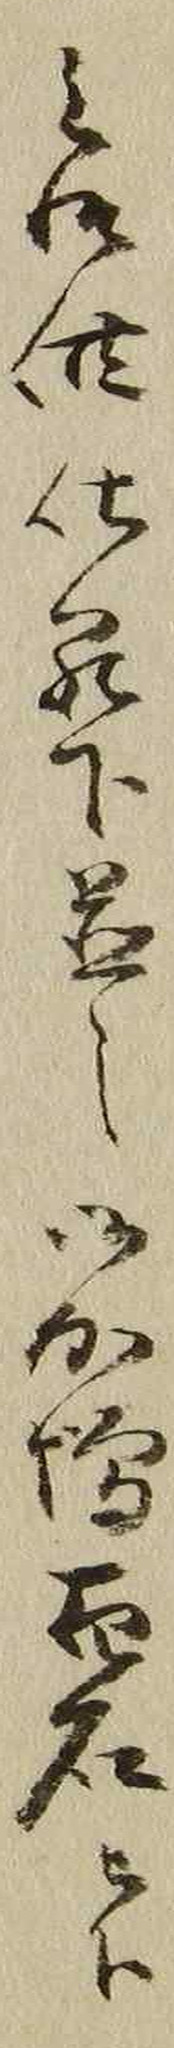之御供仕罷下並之御加増百石被下
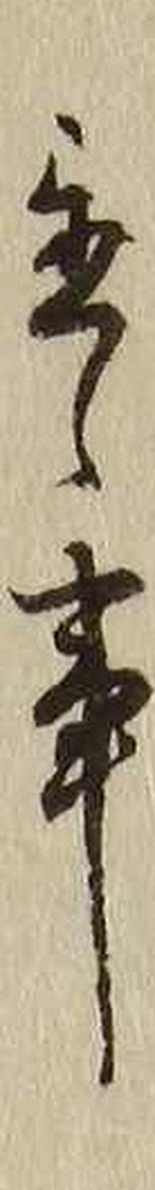置候事
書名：諸士系譜　巻之232　け之部1
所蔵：会津若松市立会津図書館
